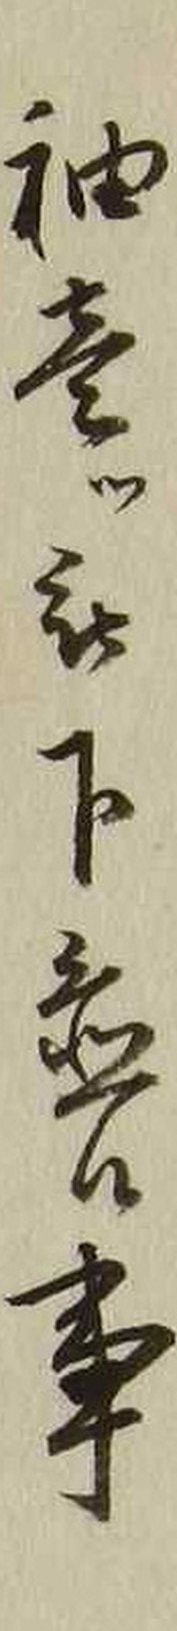袖壱つ被下置候事
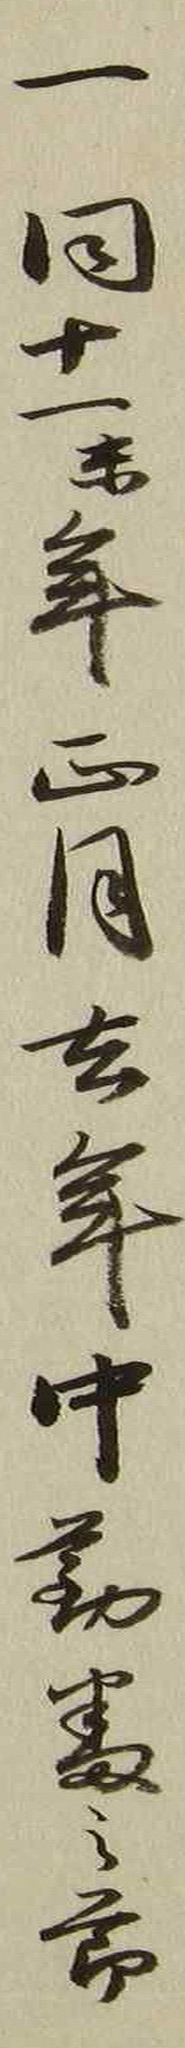一同十一未年正月去年中勤番之節
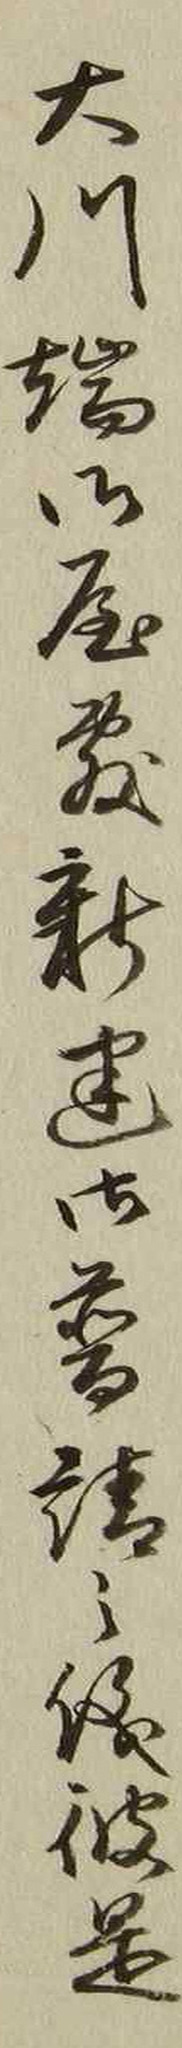大河端御屋敷新建御普請之儀彼是
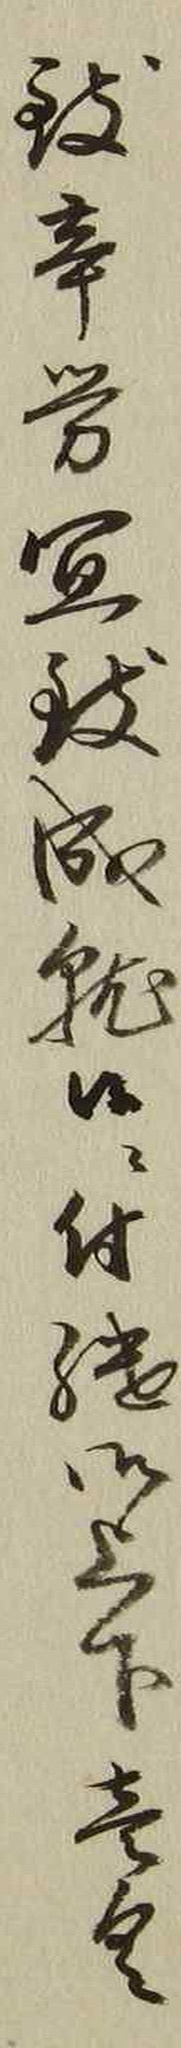致辛労宜致成就候に付継御上下壱具
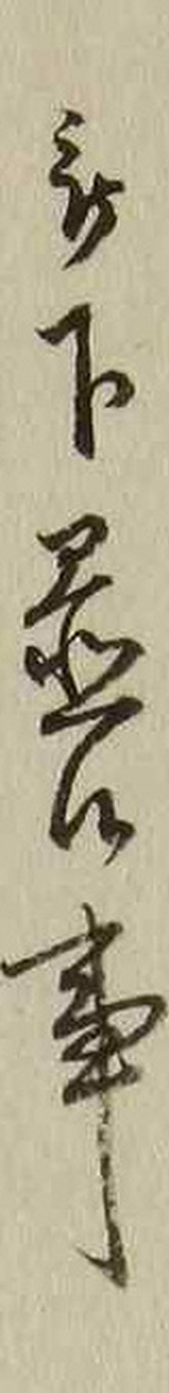被下置候事
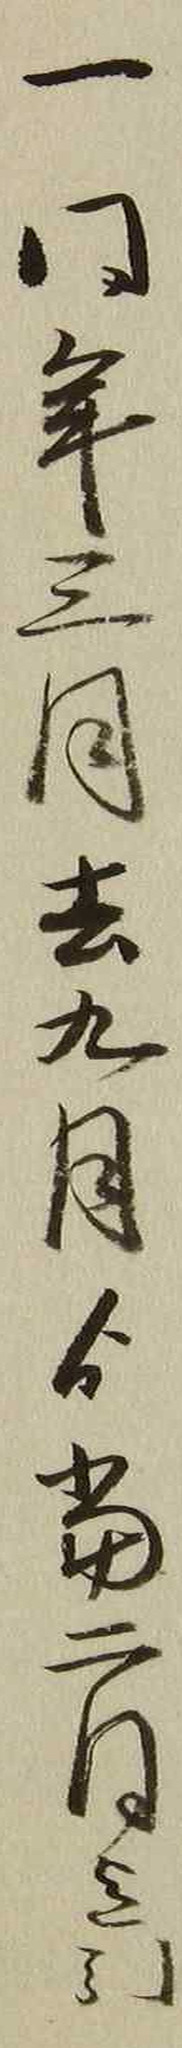一同年三月去九月ゟ当二月迄引
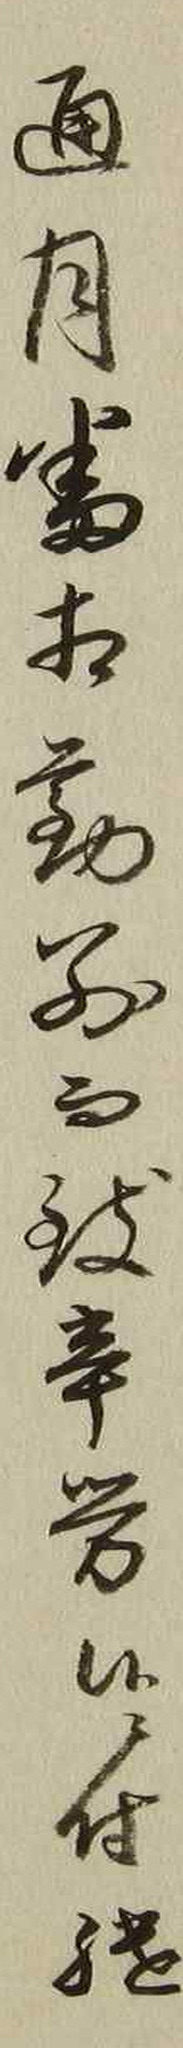通月番相勤別而致辛労候に付継
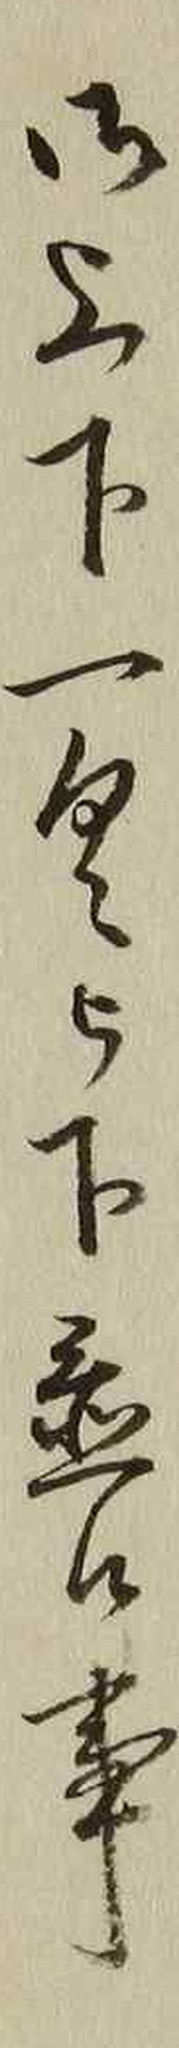御上下一具被下置候事
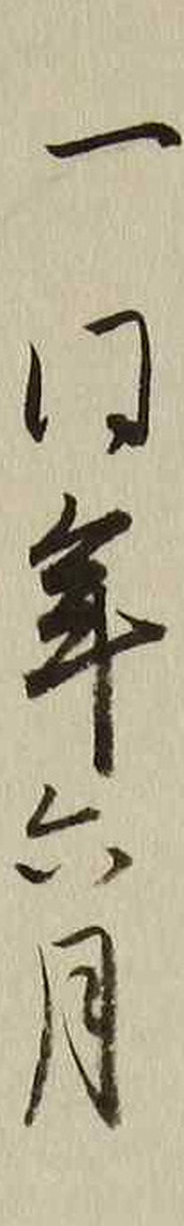一同年六月
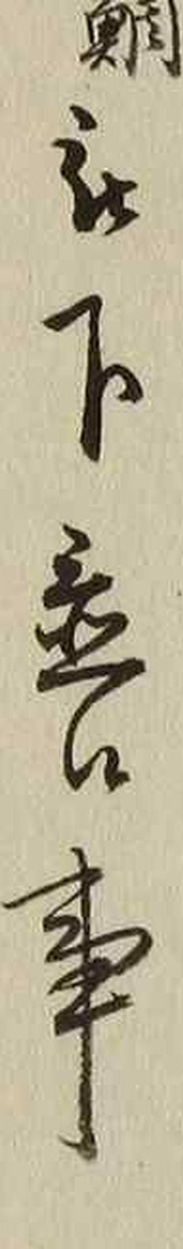被下置候事
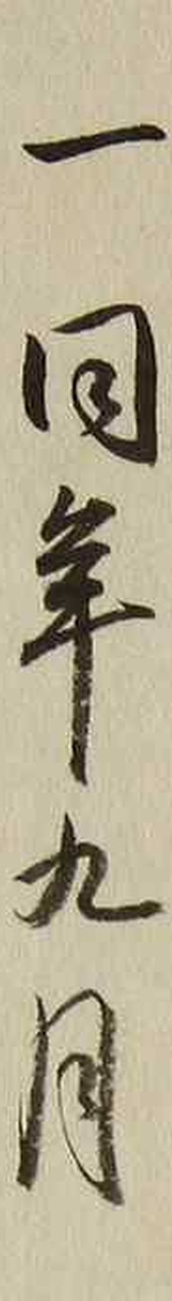一同年九月
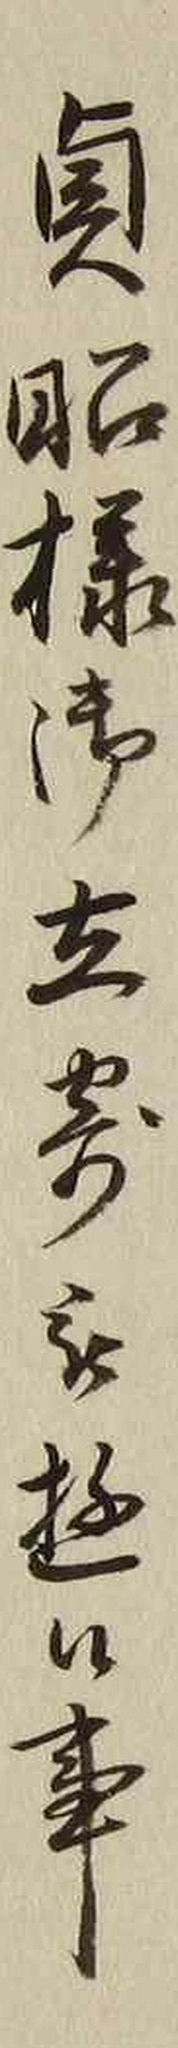貞昭様御立寄被遊候事
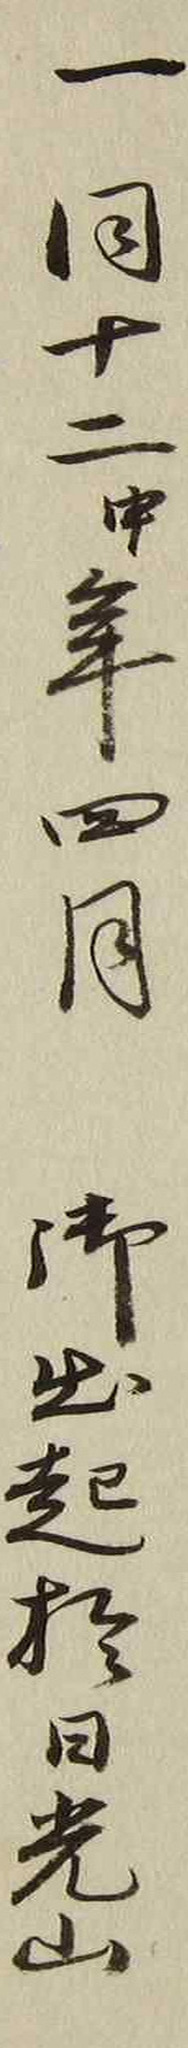一同十申年四月御出起於日光山
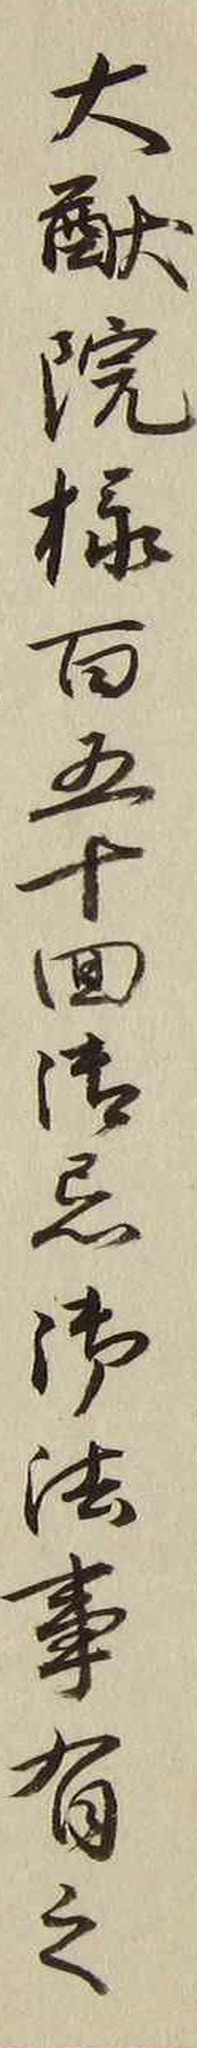大猷院様百五十回御忌御法事有之
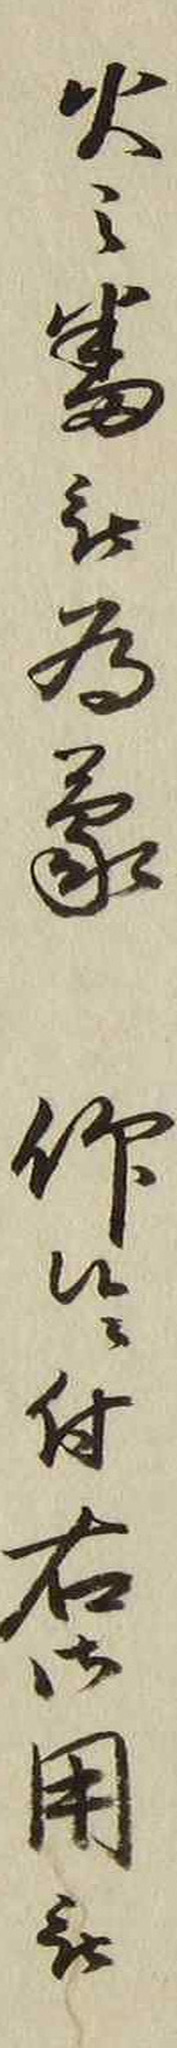火之番被為蒙仰候に付右御用被
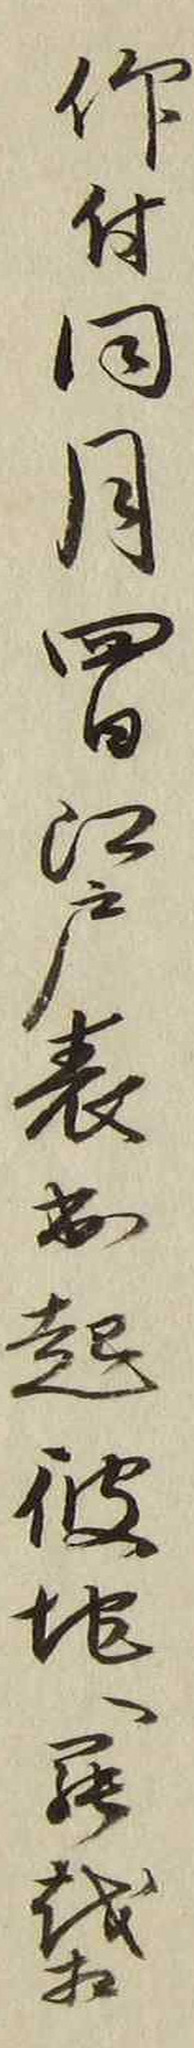仰付同月四日江戸表出起彼地へ罷越相
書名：諸士系譜　巻之125　た之部1
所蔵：会津若松市立会津図書館
